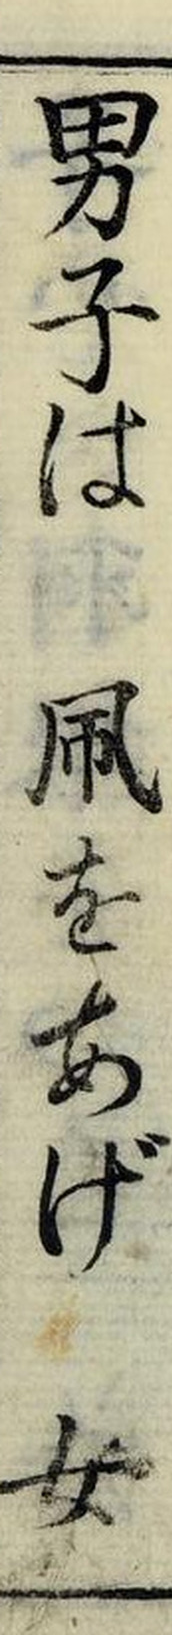男子は凧をあげ女

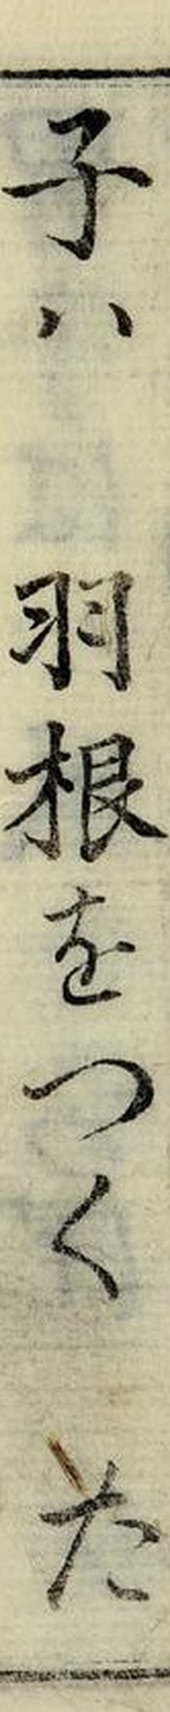子は羽根をつくた
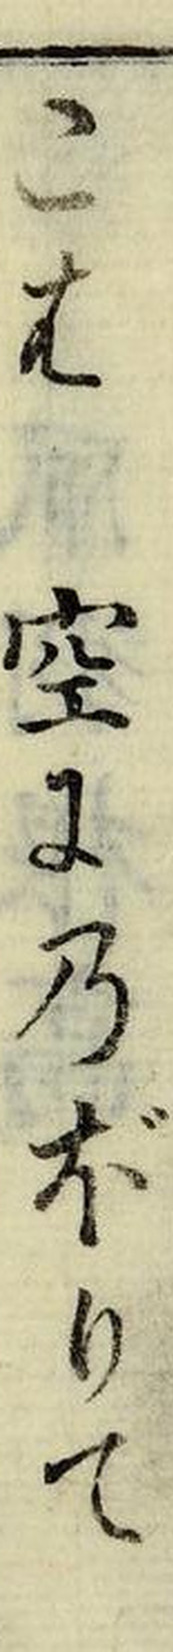こは空にのぼりて
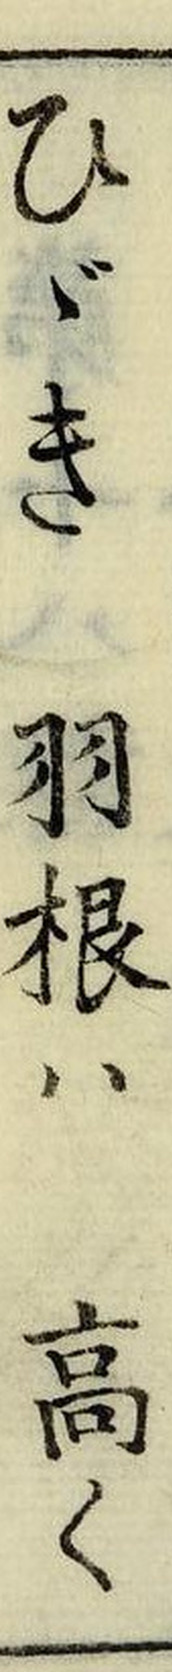ひヾき羽根ハ高く
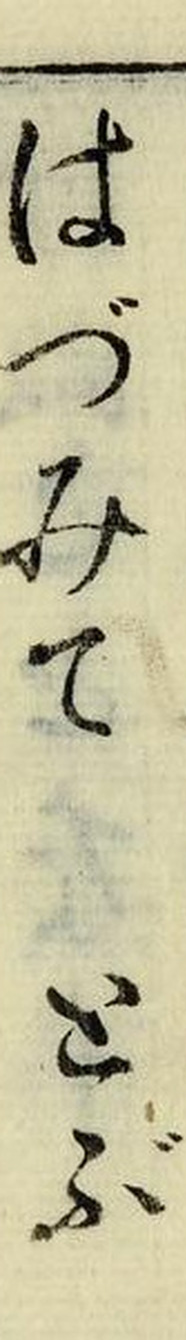はづみてとぶ
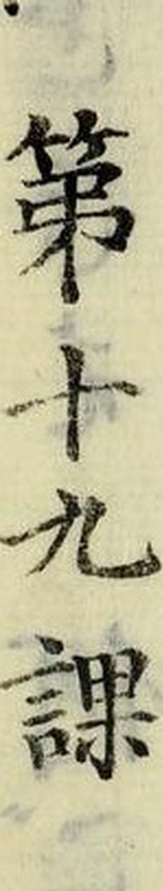第十九課
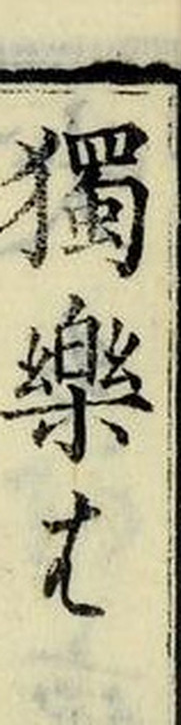独楽は
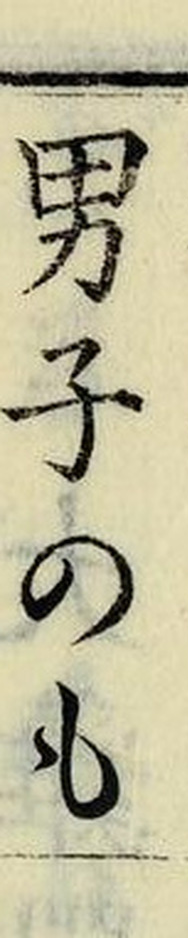男子のも
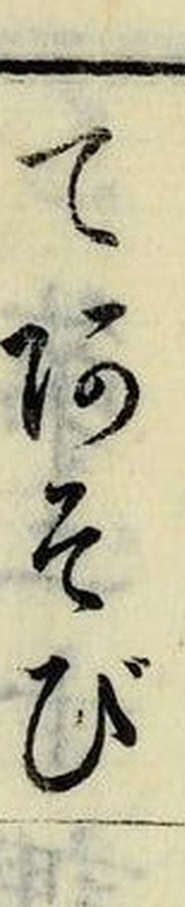てあそび
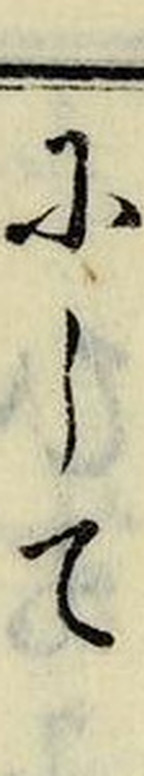にして
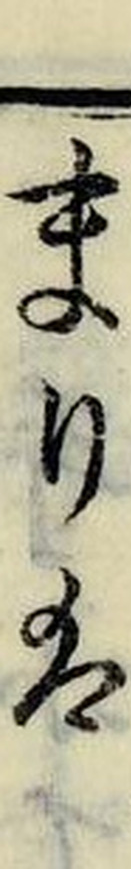まりは
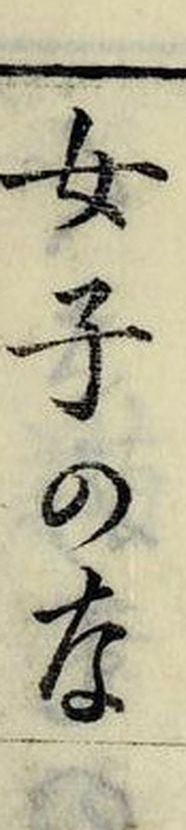女子のな

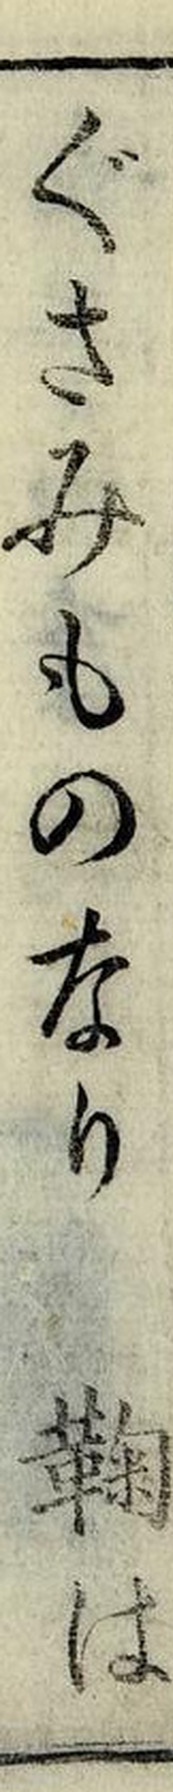ぐさみものなり鞠は
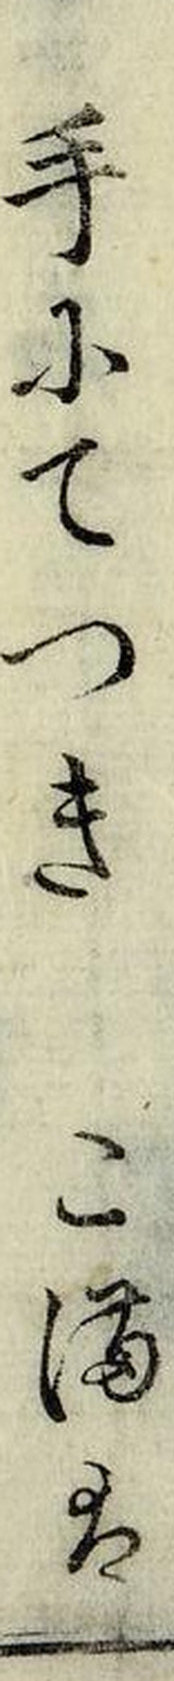手にてつきこまは
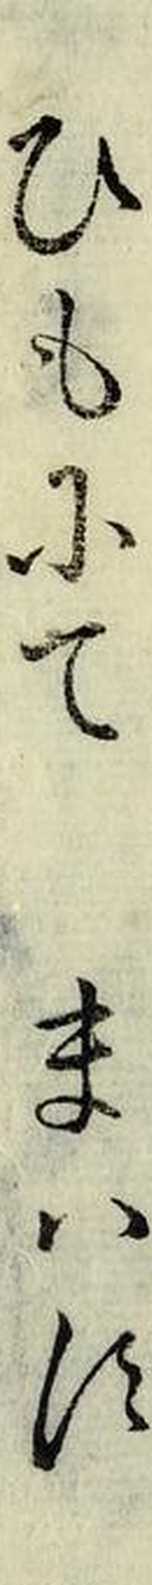ひもにてまはす
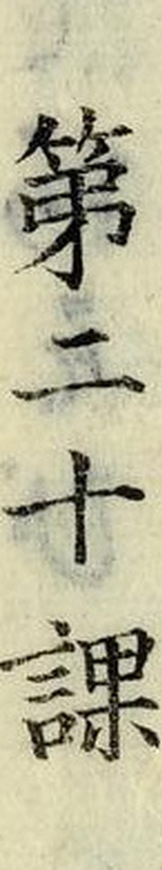第二十課
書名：小学読本 初等科 巻一
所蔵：福井県文書館 Fukui Prefectural Archives
